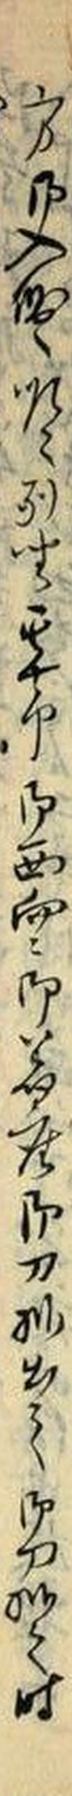方御入側へ順々列座其節御西向ニ御着座御刀掛出之御刀掛之時
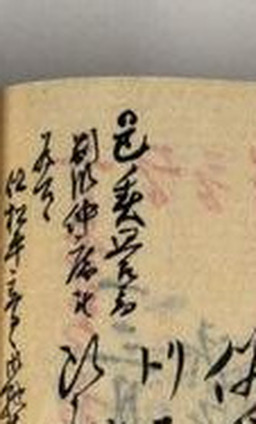〇己ノ春思召ニ而
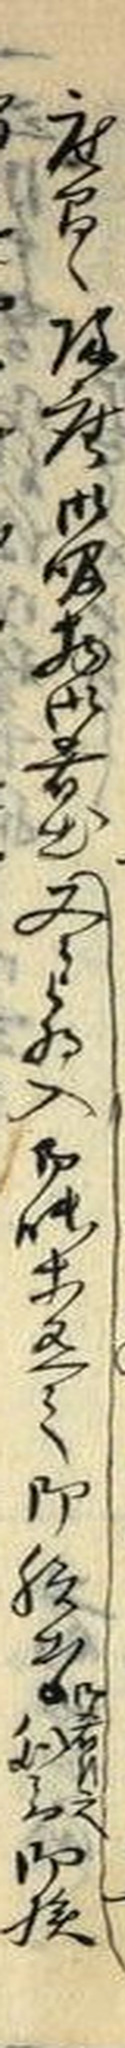座間へ帰座御吸物御肴出又々被為入御咄等有之御膳出〇御肴引之処ニ而御挨
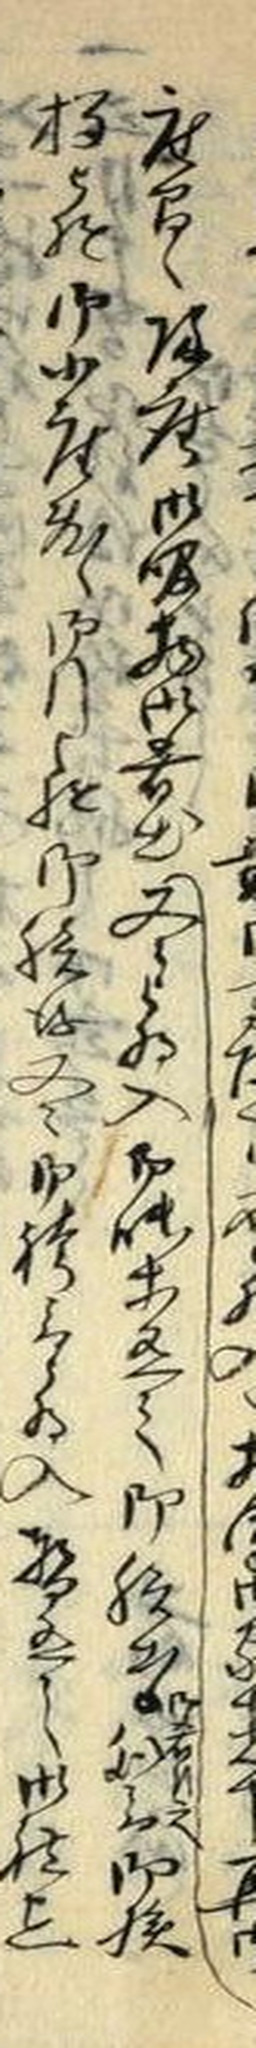拶被遊御小座敷へ御引被遊御膳後又々御袴ニ而被為入暫有之御礼申上
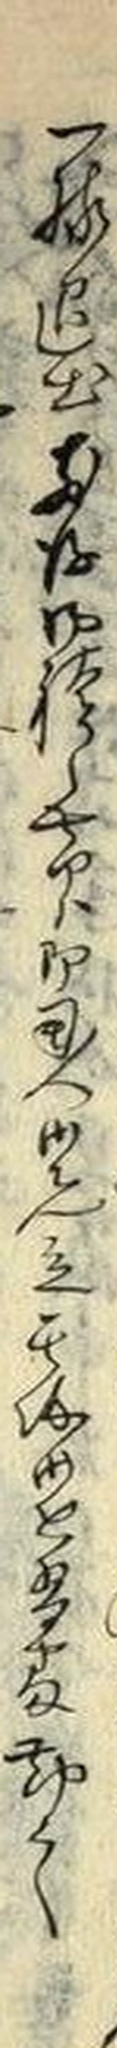一統退出前後御袴之節ハ御用人御先立其余御近習番勤之
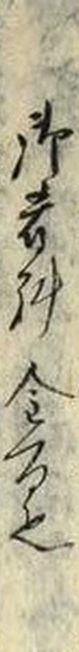御肴料金百疋
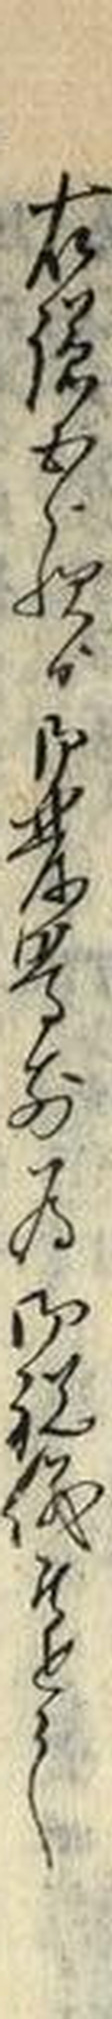右謙五郎様ゟ御発駕前為御祝儀被進之
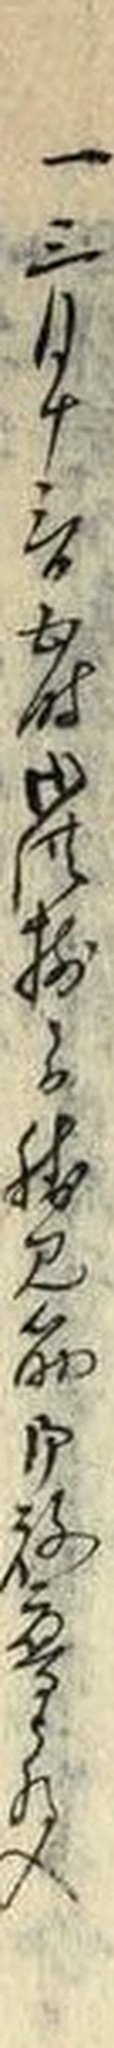一三月十三日五時御供揃ニ而勝見筋御放鷹被為入
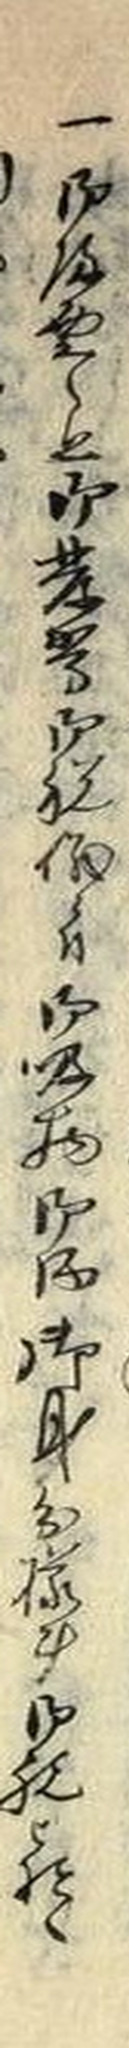一御帰殿之上御発駕御祝儀ニ付御吸物御酒御見分様斗御祝被遊候
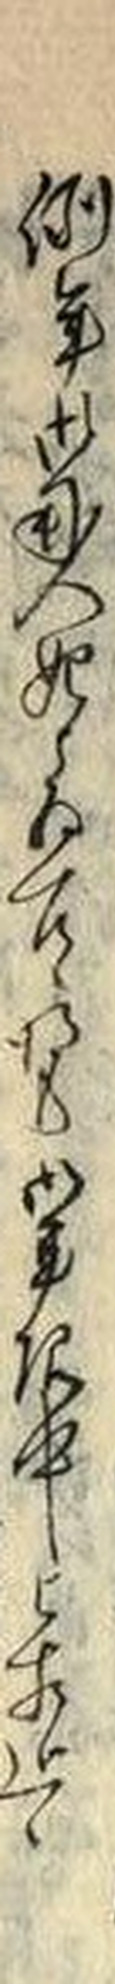例年御用人始被為召候得共御年限中被相止候
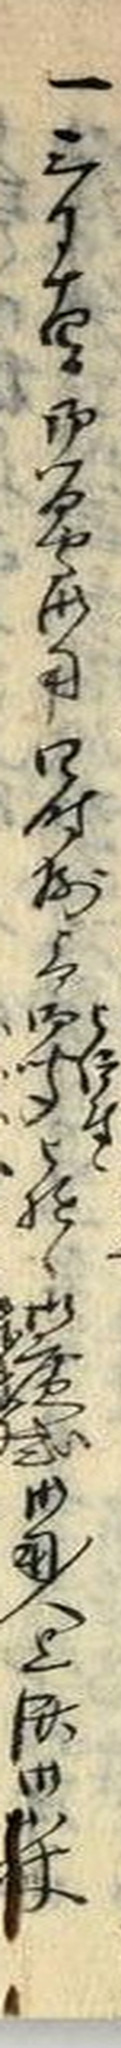一三月十四日御留守御用四時揃ニ而被仰付候御聞被遊候御広式御用人迄済御小
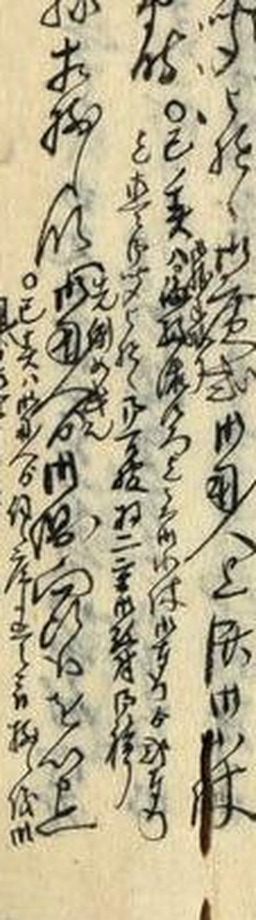迄直ニ御聞被遊候御召服羽二重御紋付御袴

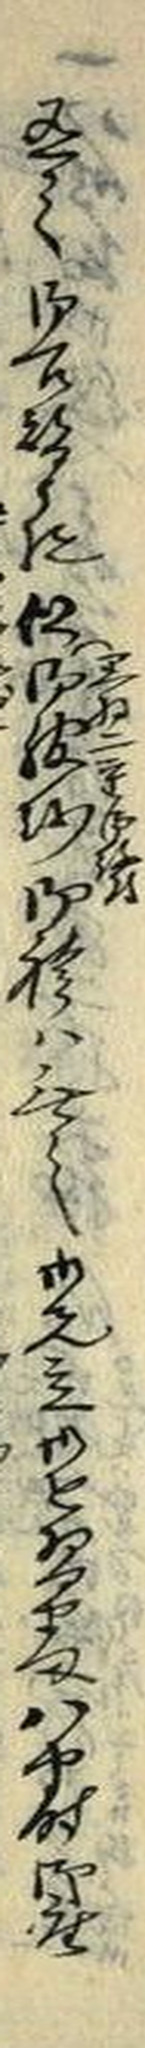有之御召替被遊但黒羽二重御紋付御服紗御袴ハ無之御先立御近習番八半時御座
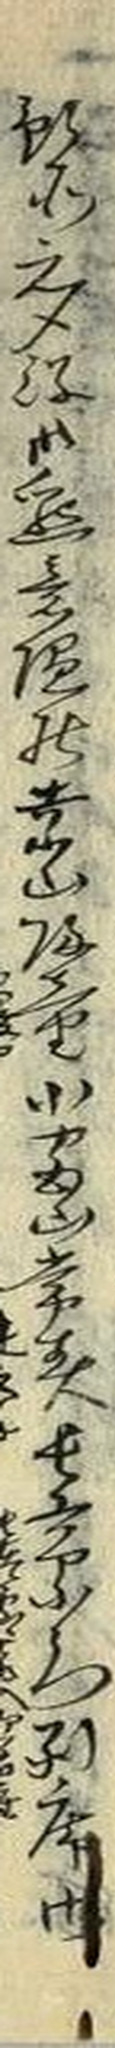預所元〆役御懇意隠居桑山帰重小宮山常春長谷部小右衛門列席御
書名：少傅日録抄（斉承付側向頭取日記、在国）
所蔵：福井県文書館 Fukui Prefectural Archives
